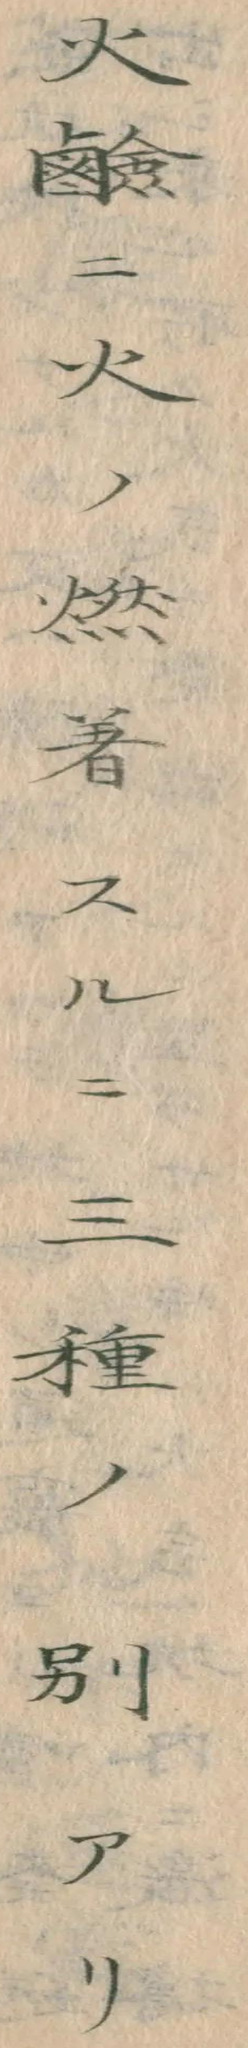火鹸ニ火ノ燃著スルニ三種ノ別アリ
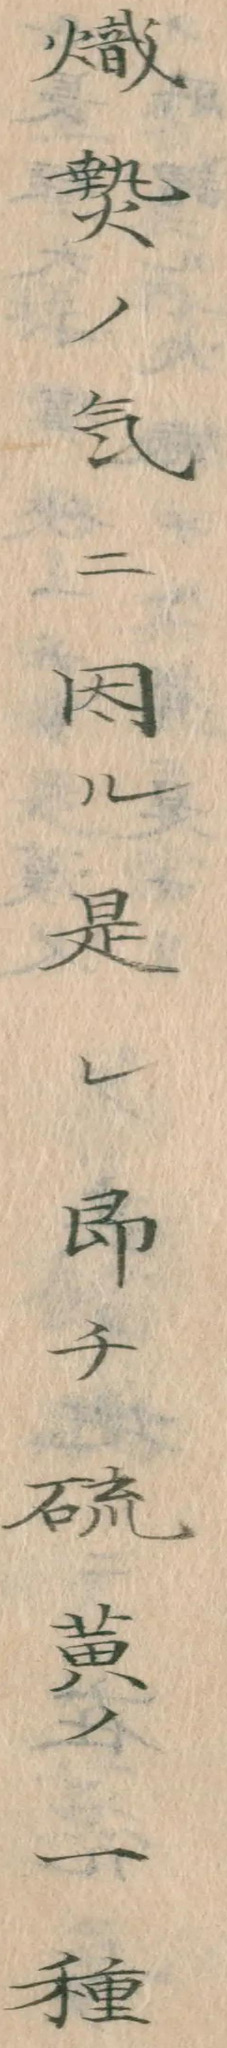熾熱ノニル是レ即チ硫黄ノ一種
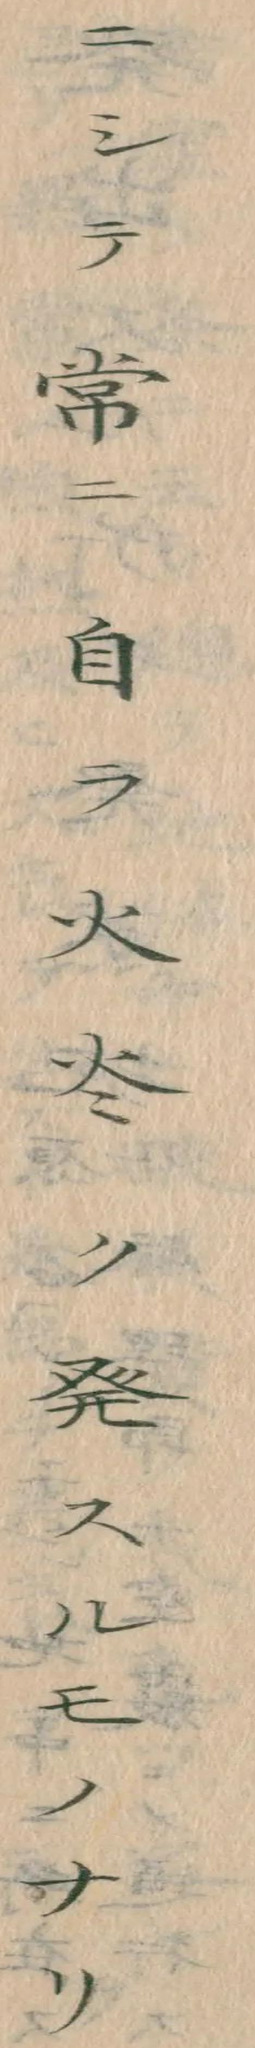ニシテ常ニ自ラ火発スルモノナリ
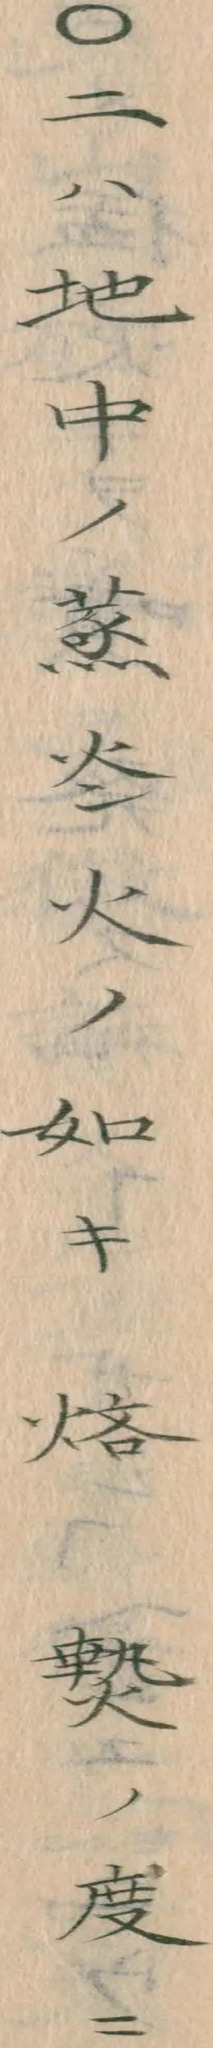○二ハ地中ノ蒸火ノ如キ熱ノ度ニ
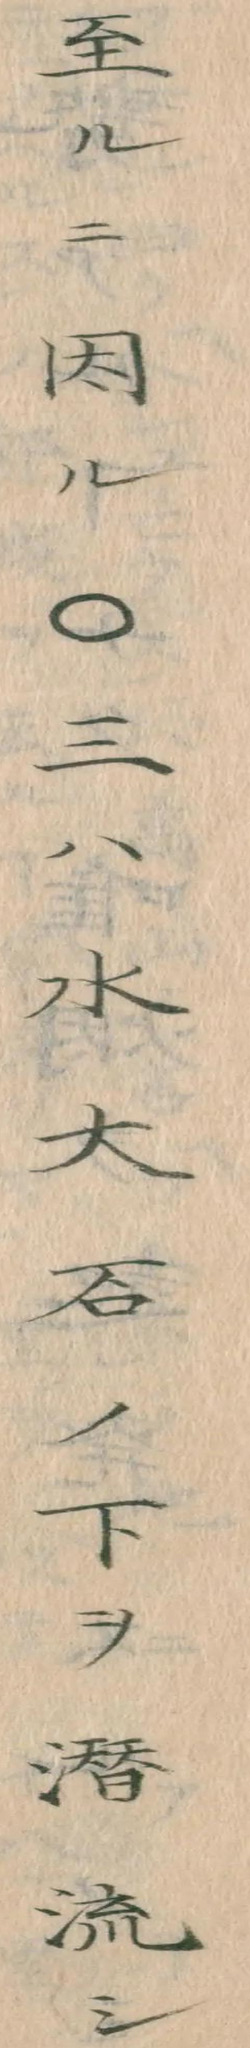至ルニル○三ハ水大石ノ下ヲ潜流シ
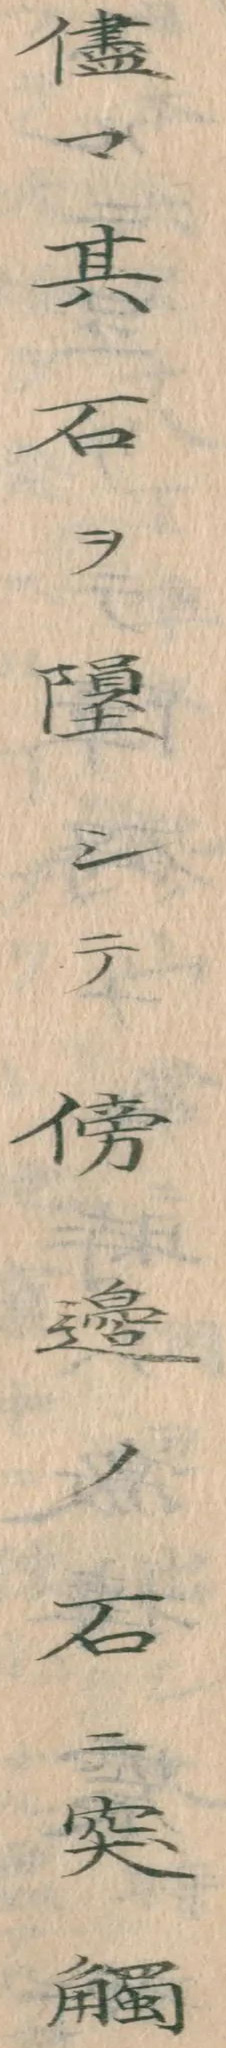儘マ其石ヲシテ傍辺ノ石ニ突触
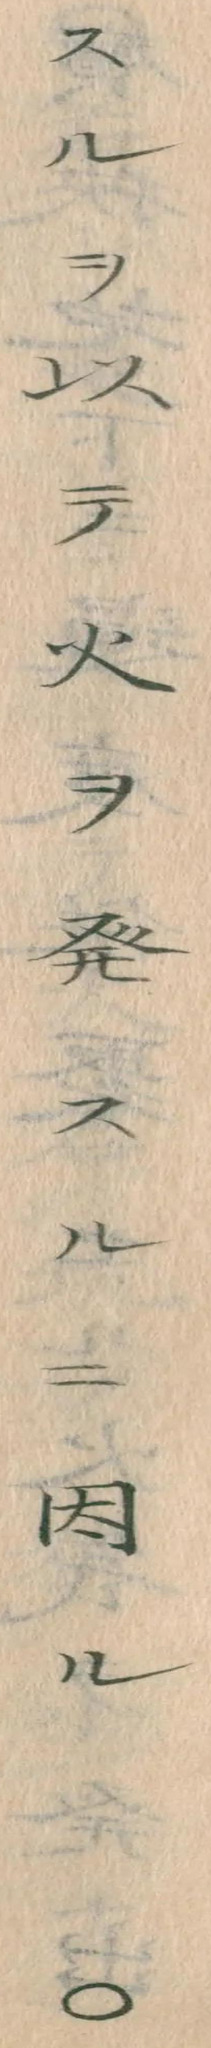スルヲ以テ火ヲ発スルニル○
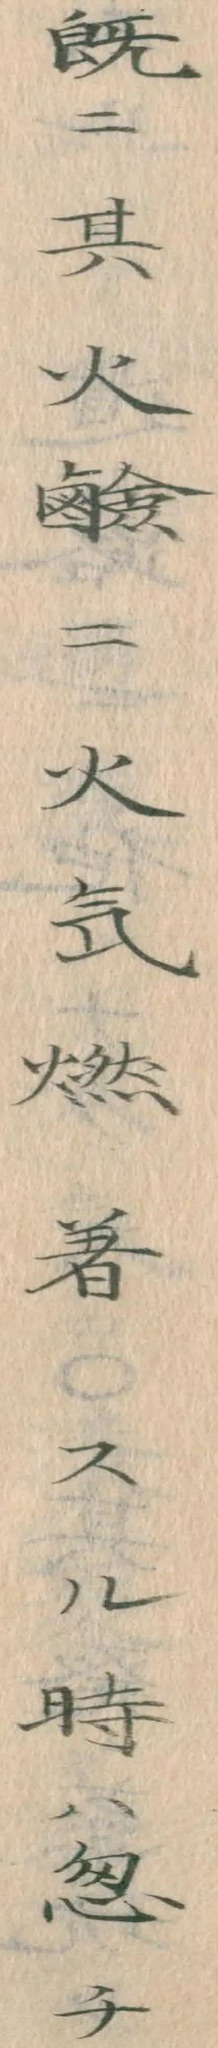既ニ其火鹸ニ火燃著スル時ハ忽チ
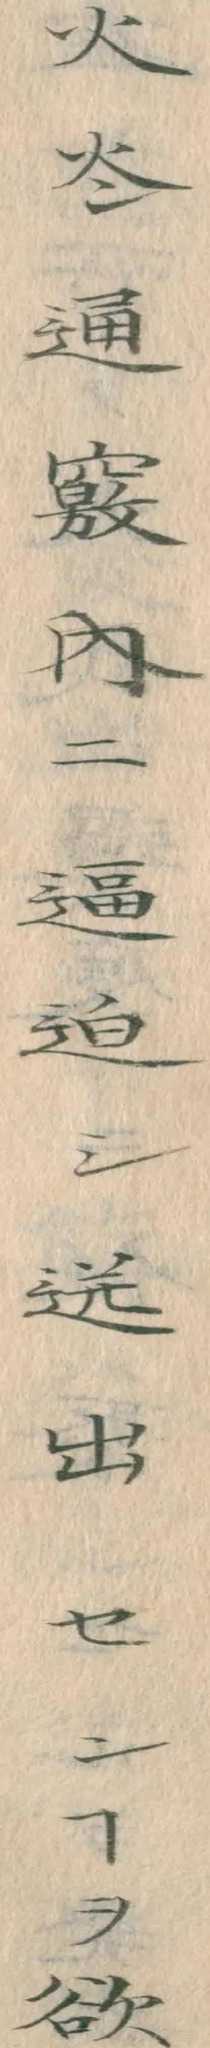火通竅内ニ逼迫シ迸出セン事ヲ欲
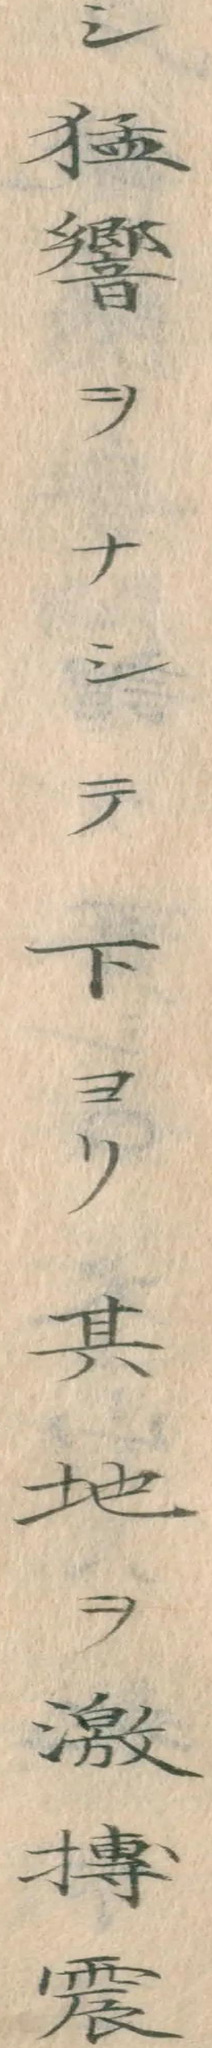シ猛響ヲナシテ下ヨリ其地ヲ激搏震
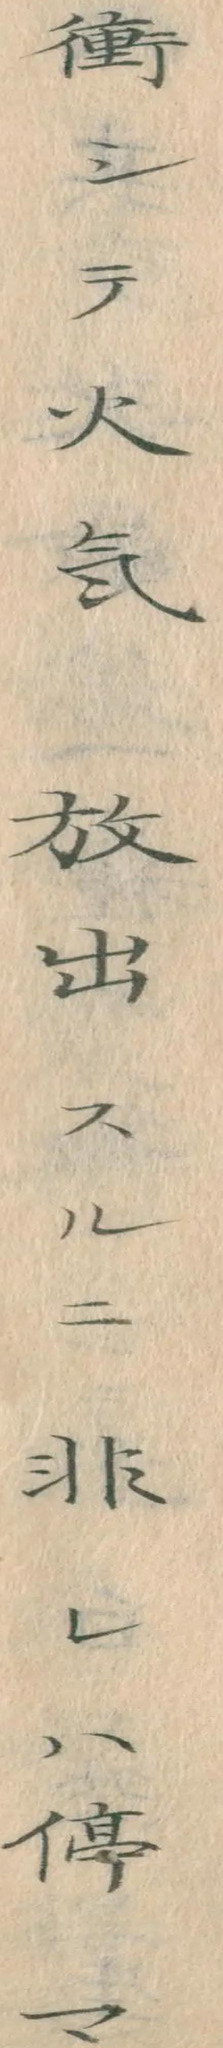衝シテ火放出スルニ非レハ停マ

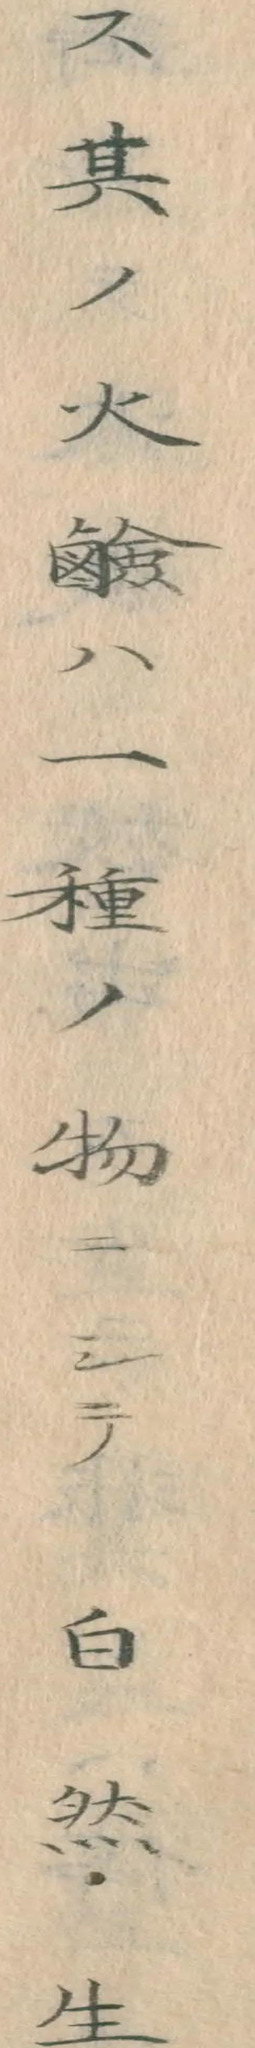ス其ノ火鹸ハ一種ノ物ニシテ白然生
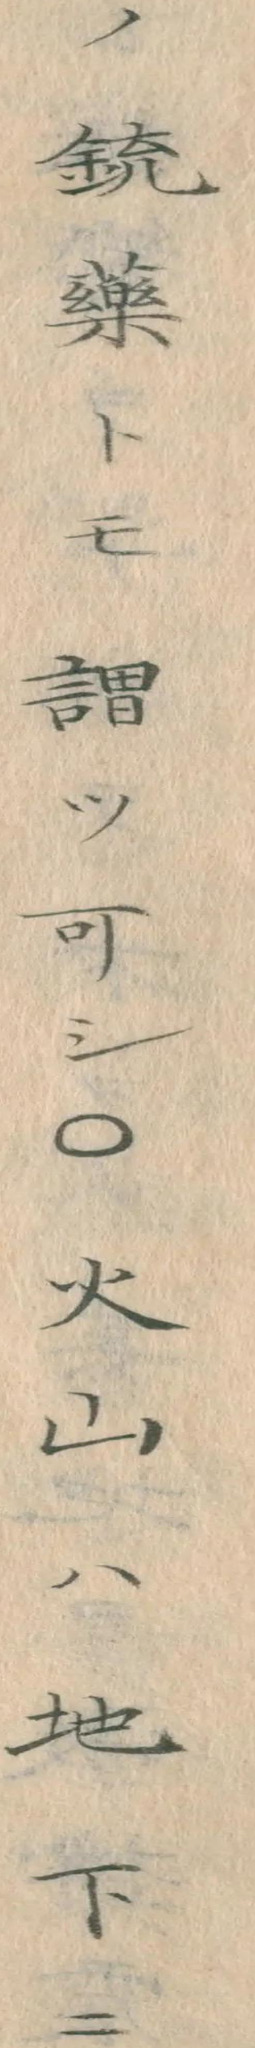ノ銃薬トモツ可シ○火山ハ地下ニ
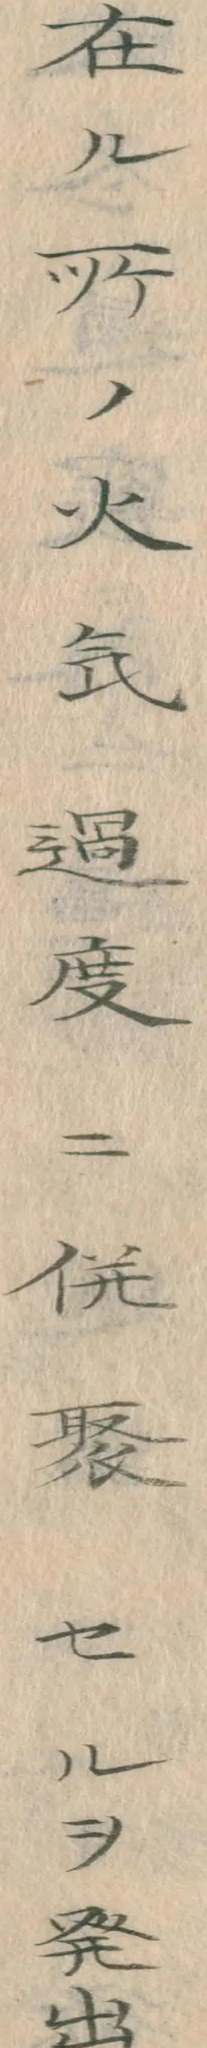在ル所ノ火過度ニ併聚セルヲ発出
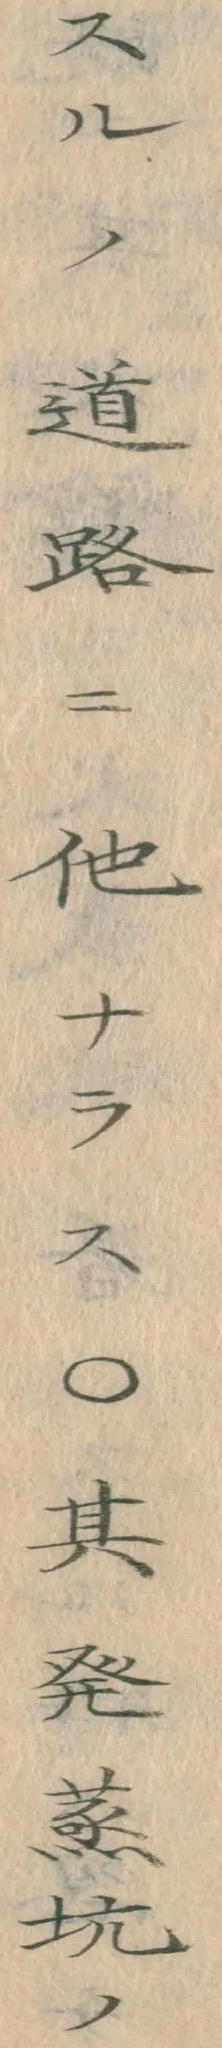スルノ道路ニ他ナラス○其発蒸坑ノ
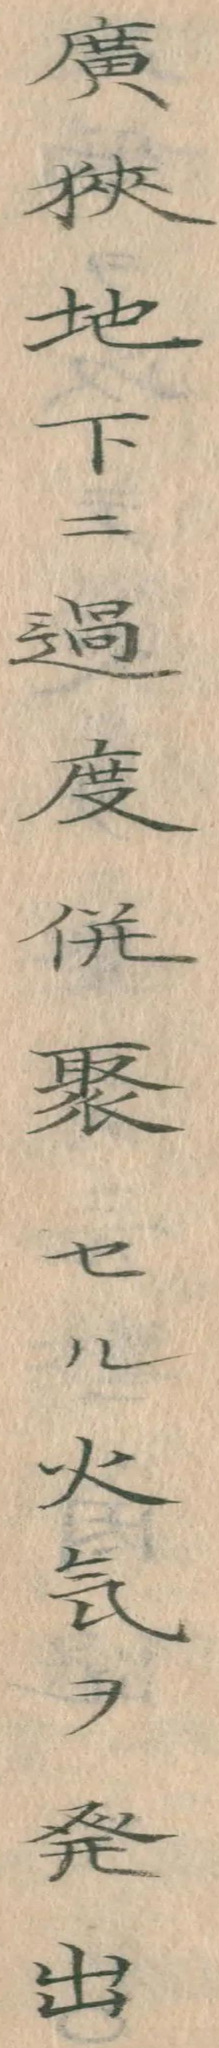広狭地下ニ過度併聚セル火ヲ発出
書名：輪池叢書. 12
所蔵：国立国会図書館 National Diet Library, JAPAN
